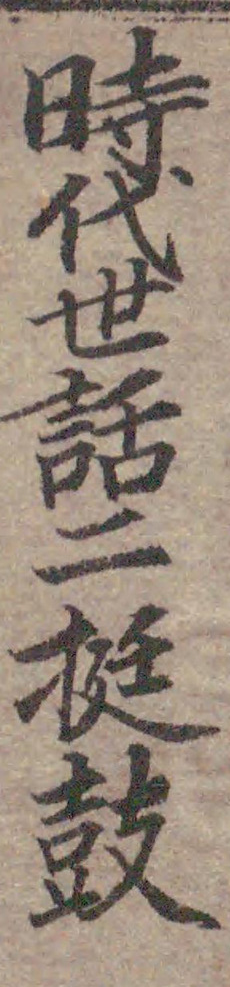時代世話二挺皷

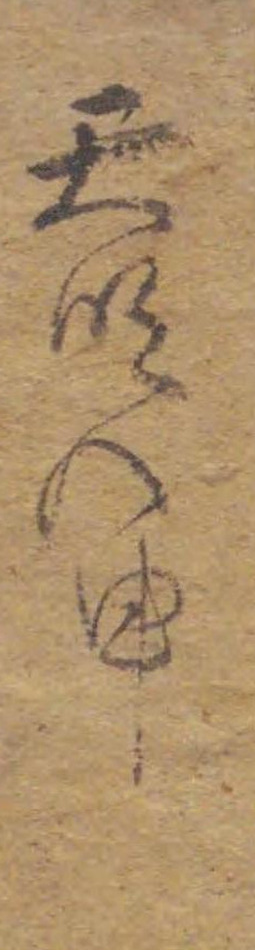天明八申

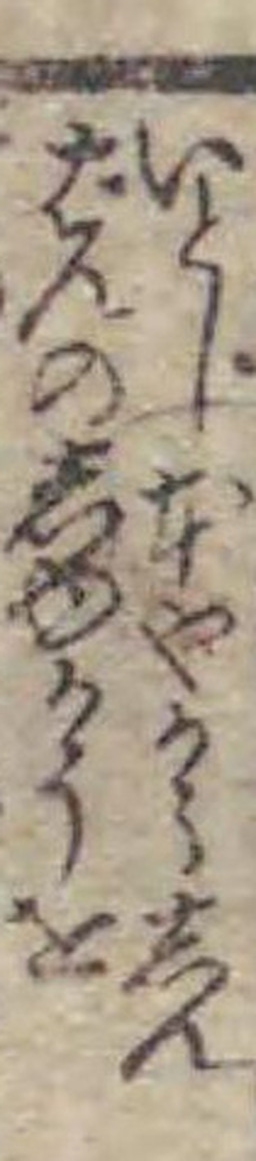ばんのしゆかうを
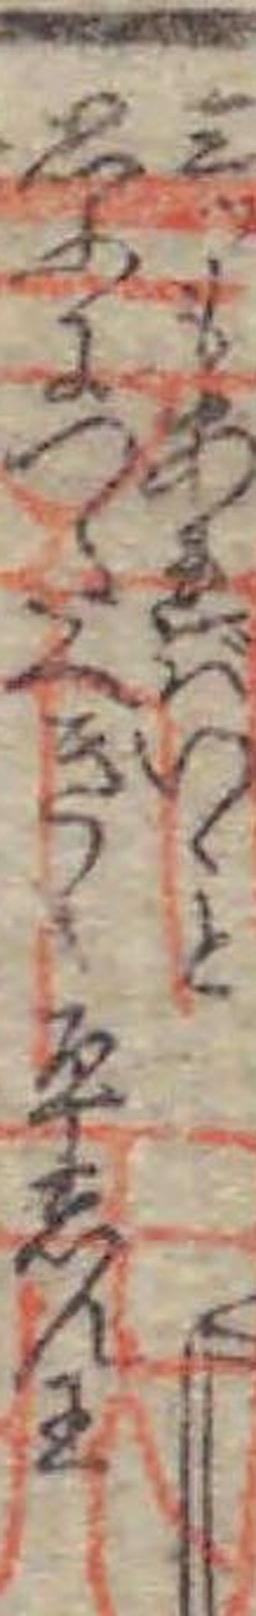思ふにつたへきく平しん王
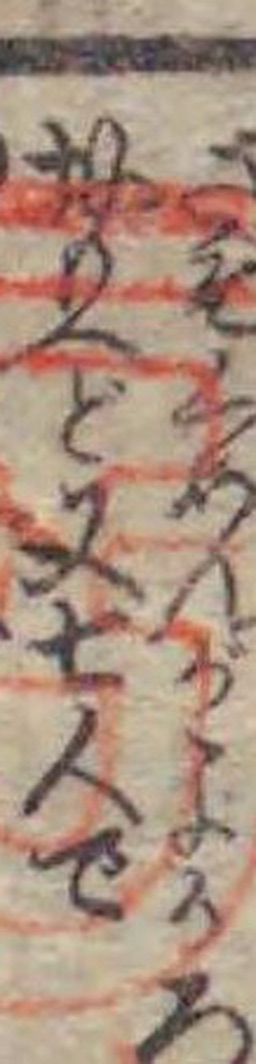おもへど又七人で
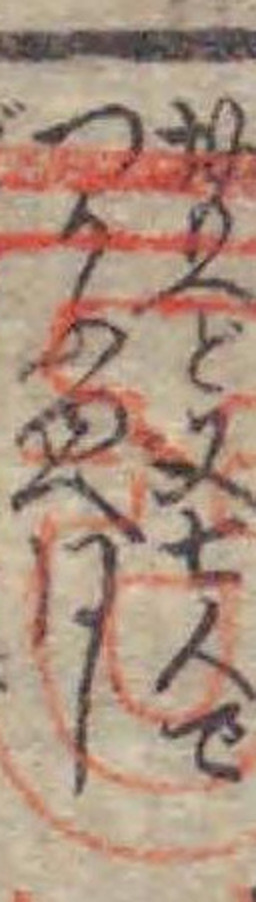つかふゆへ同し
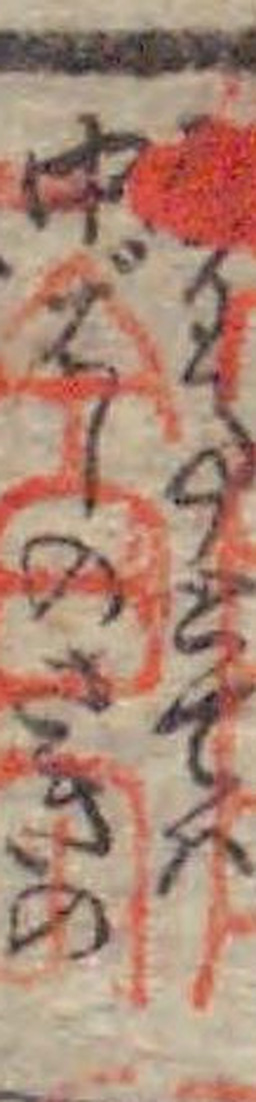中ばしのさきの
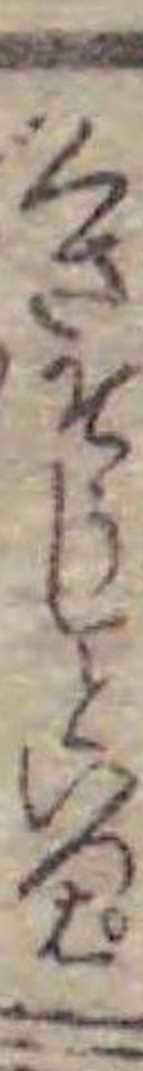くさそうしといつぱ
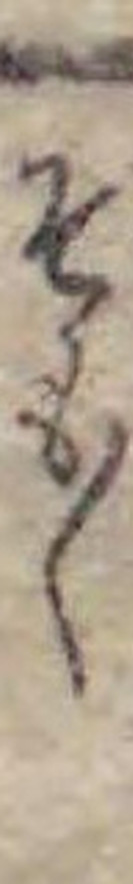そも〳〵
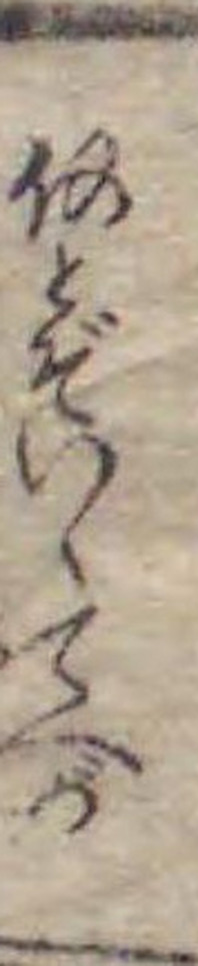何とぞいゝてへが
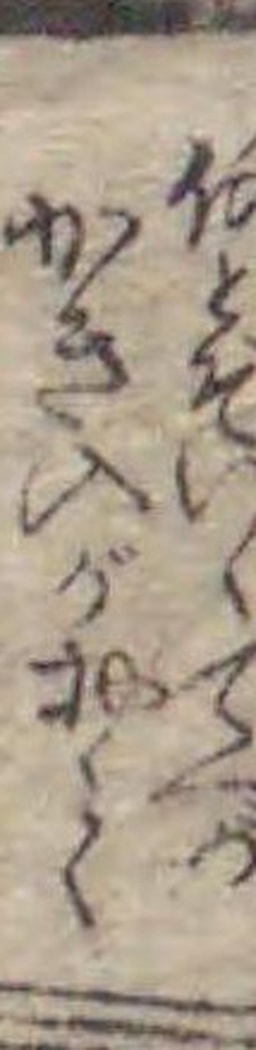かき入がおゝく
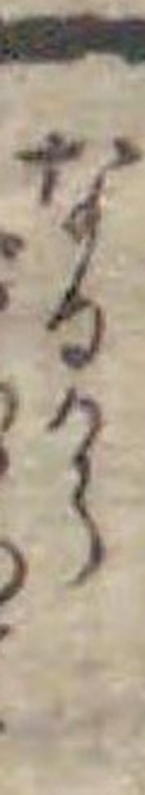なるから
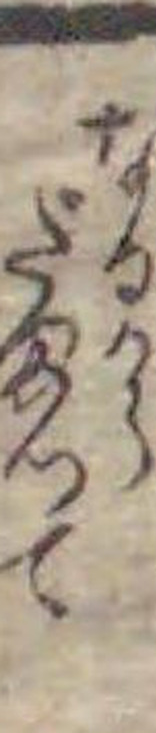なるから
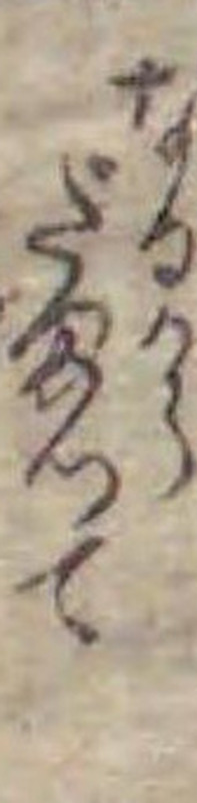だまつて
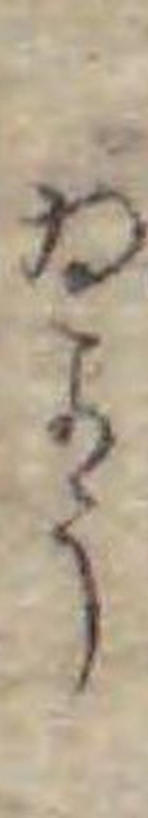ゐよう

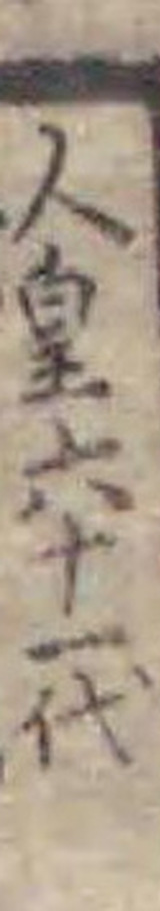人皇六十一代
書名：時代世話二挺皷 : 2巻
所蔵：国立国会図書館 National Diet Library, JAPAN
